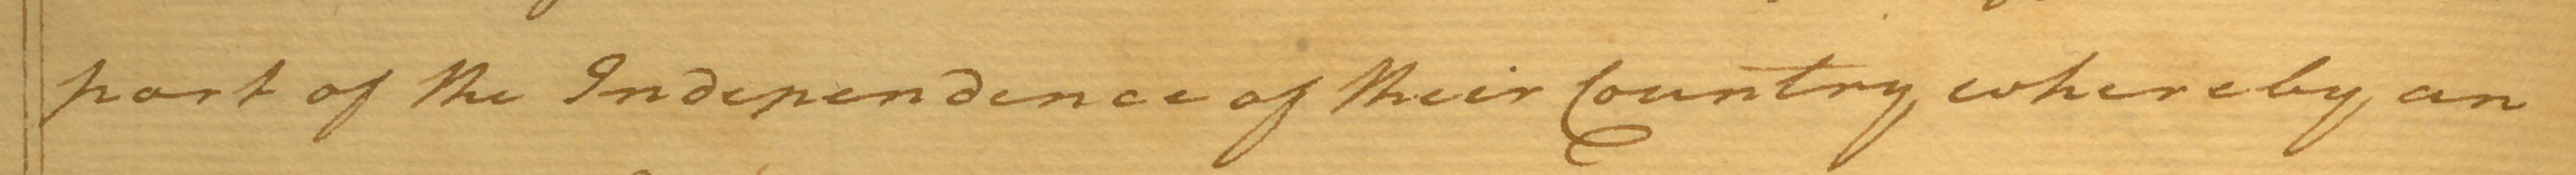port of the Independence of their Country whereby an
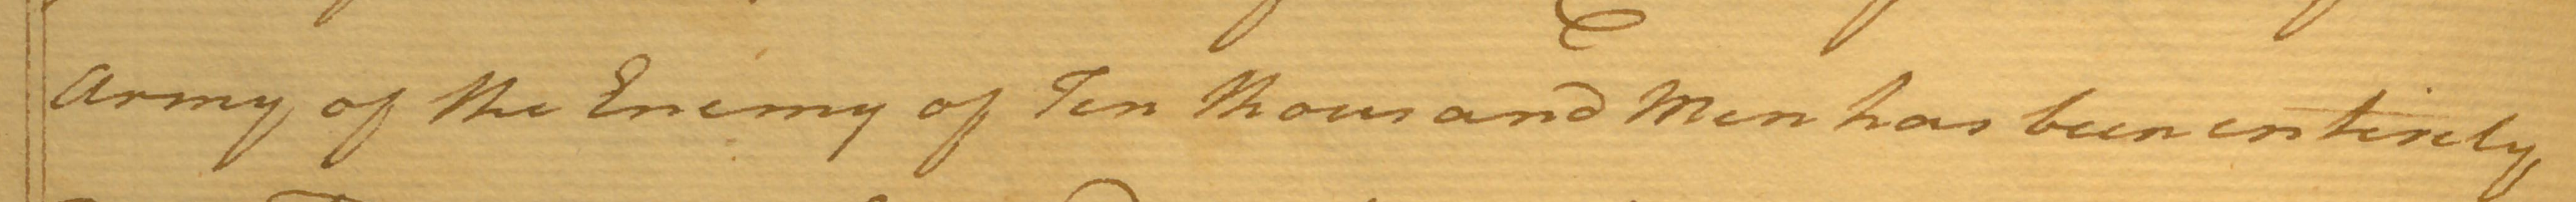Army of the Enemy of Ten thousand Men has been entirely
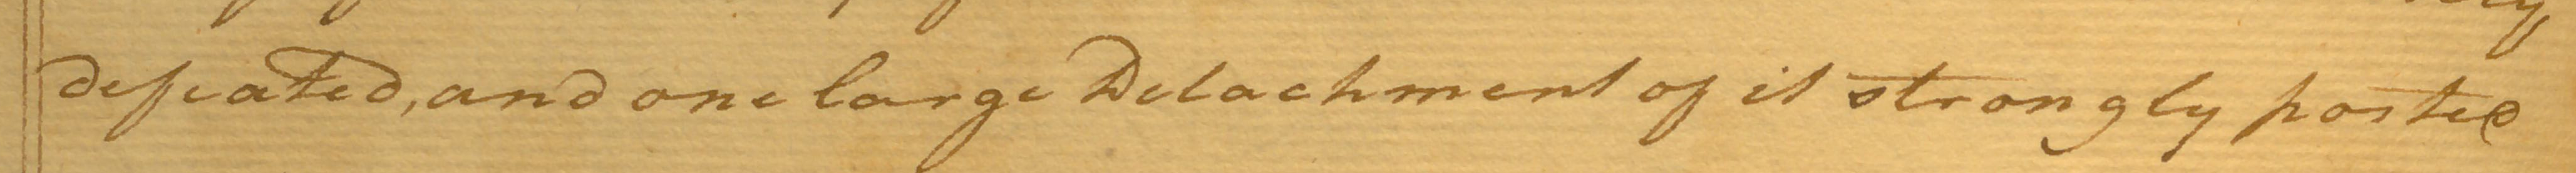defeated, and one large Detachment of it strongly posted
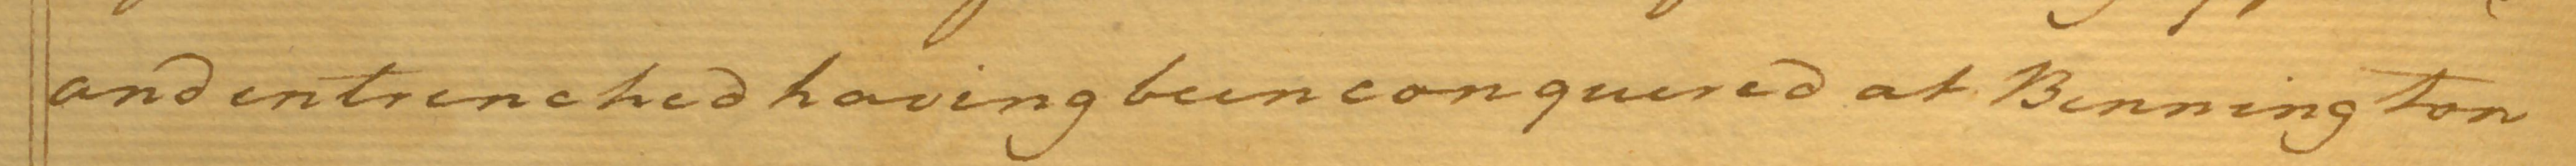and entrenched having been conquered at Bennington
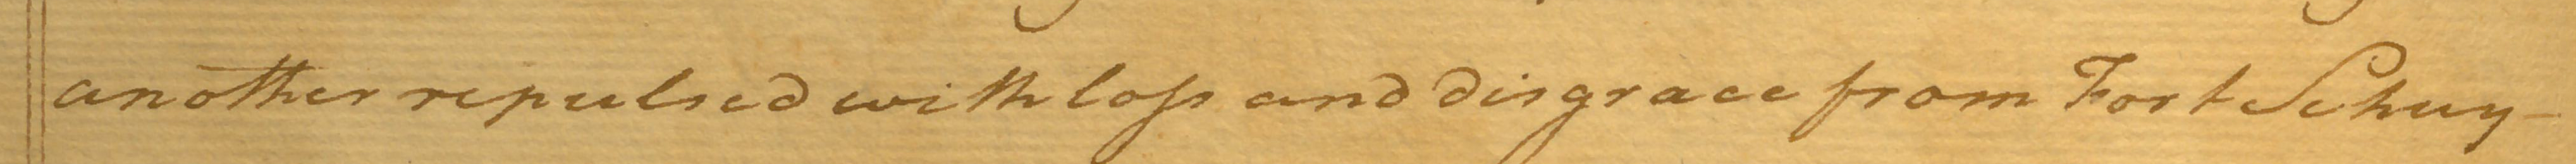another repulsed with loss and disgrace from Fort Schuy-
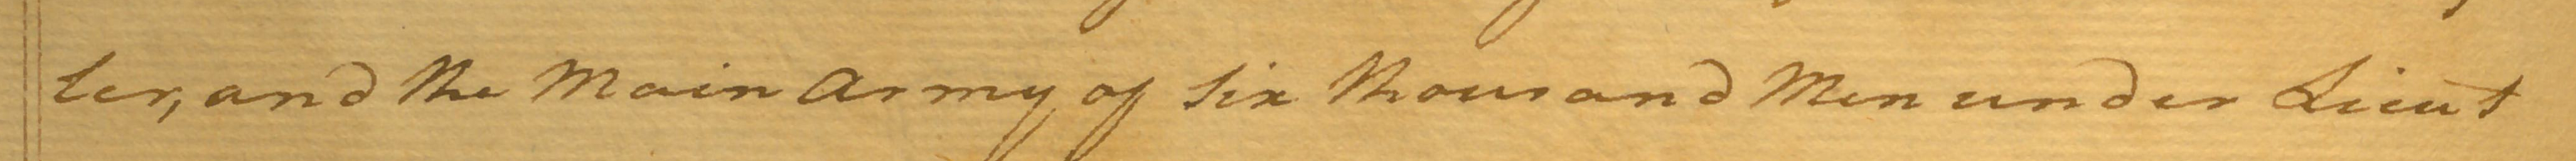ler; and the Main Army of six thousand Men under Lieut
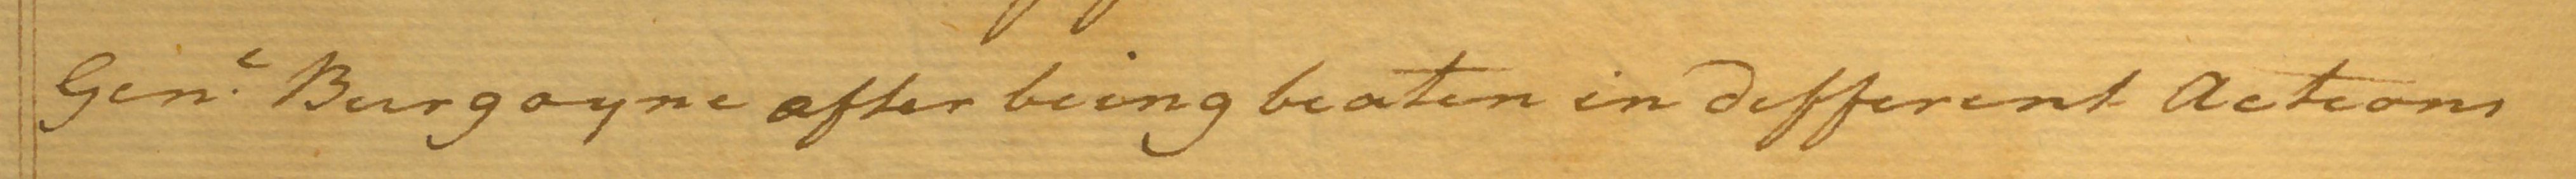Gen^l. Burgoyne after being beaten in different Actions
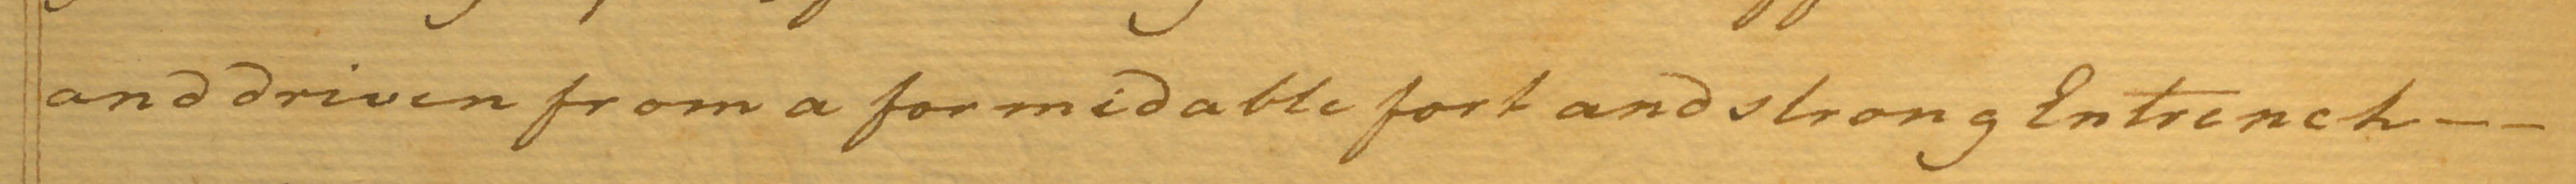and driven from a formidable fort and strong entrench--
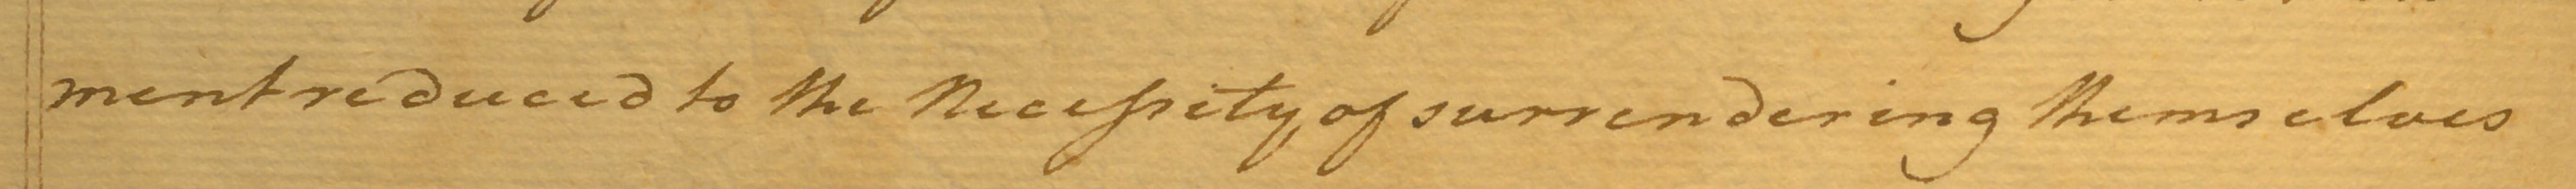ment reduced to the Necessity of surrendering themselves
